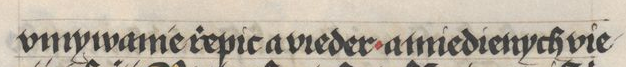vmywaníe ṙepic a vieder.a miedienych vie¬
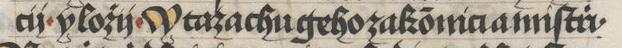cij.y lożij.Y tazachu geho zakōnici a miſtṙi.
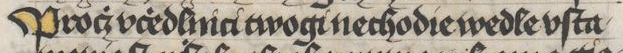Procż vċedlnici twogi nechodíe wedle vſta¬
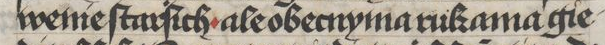wene ſtarẛich.ale obecnyma rukama gie¬
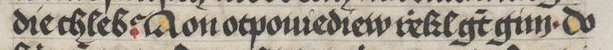díe chleb? A on otpouiediew ṙekl ḡt gím.Do¬
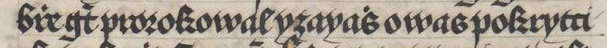bṙe ḡt prorokowal yzayaṡ o was pokrytci¬
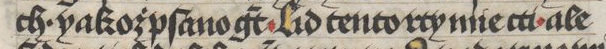ch.yakoż pſano ḡt.Lid tento rty mie ctí.ale
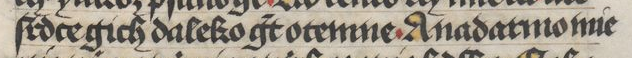ſrdce gich daleko ḡt otemne.A nadarmo mie
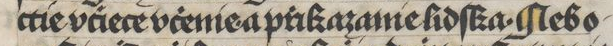ctíe včiece vċeníe.a pṙikazanie lidſka. Neb o¬
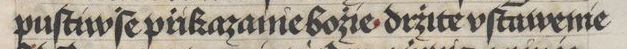puſtiwẛe pṙikazanie bożíe.drżíte vſtaweníe
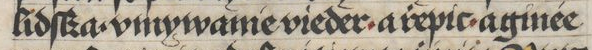lidſka.vmywaníé vieder.a ṙepic.a ginée
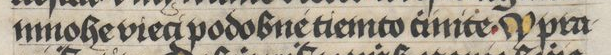mnohe vieci podobné tiemto ċiníte.Y pra¬
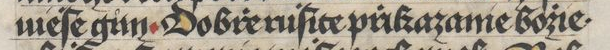uíeẛe gim.Dobṙe ruẛite pṙikazanie bożíe.
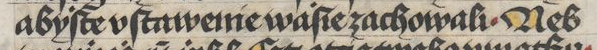abyẛte vſtaweníe waẛie zachowali.Neb
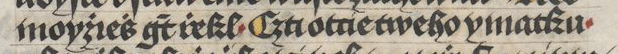moyżíeṡ ḡt ṙekl.Czti otcie tweho y matku.
